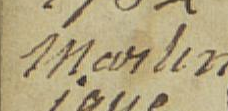Martin
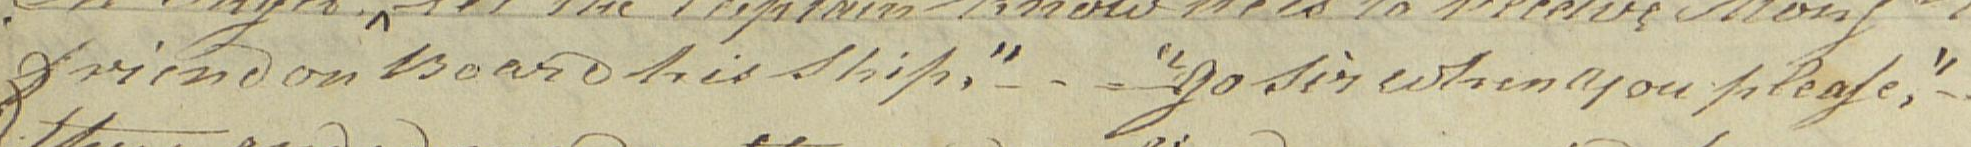friend on Board his Ship." "go sir when you please,"
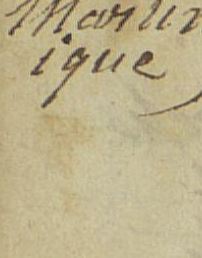ique
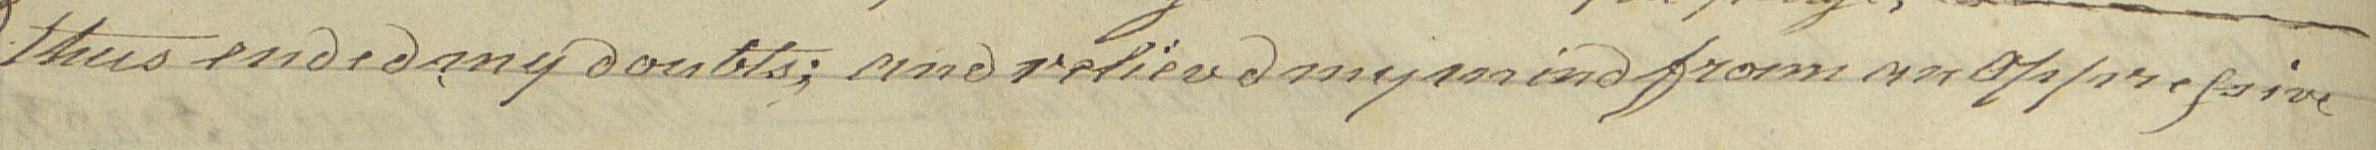thus ended my doubts; and relievd my mind from an Oppressive
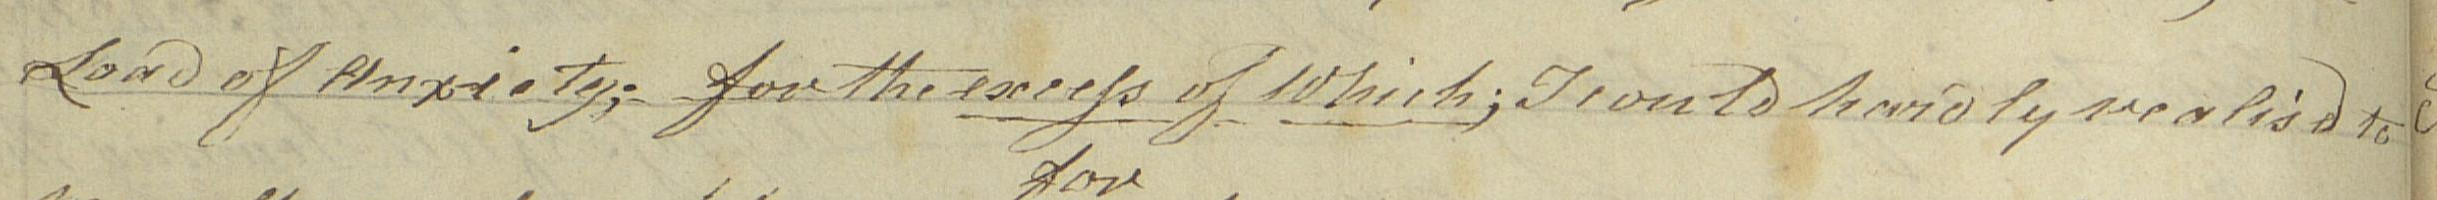Lord of Anxiety; for the excess of which; I would hardly realis'd to
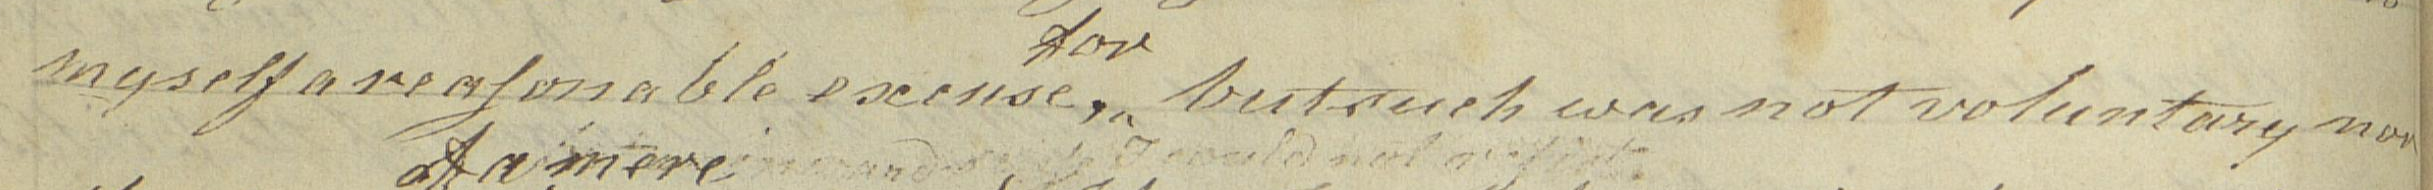myself a reasonable excuse, ^ but such was not voluntary nor
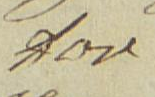for
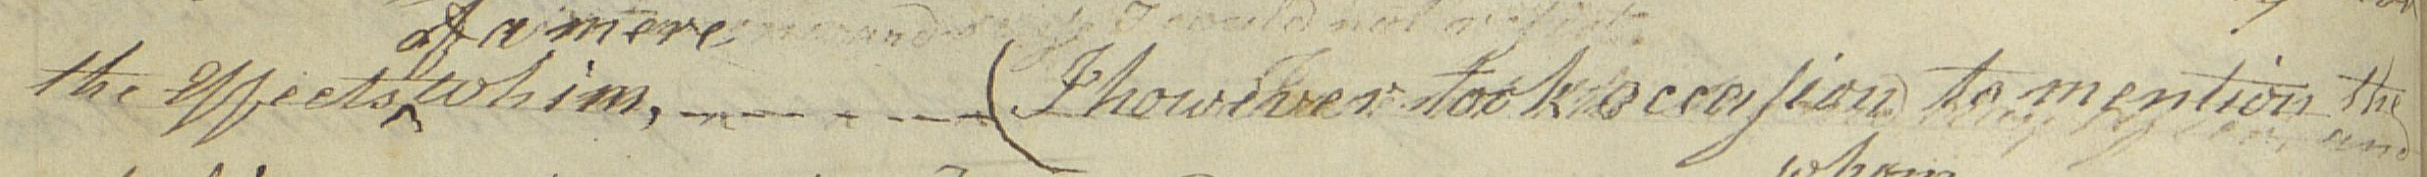the Effect ^ whim, (I however took Occasion to mention the
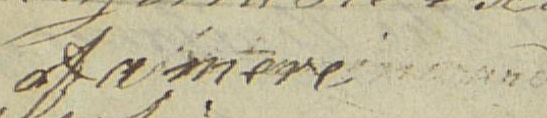of a mere
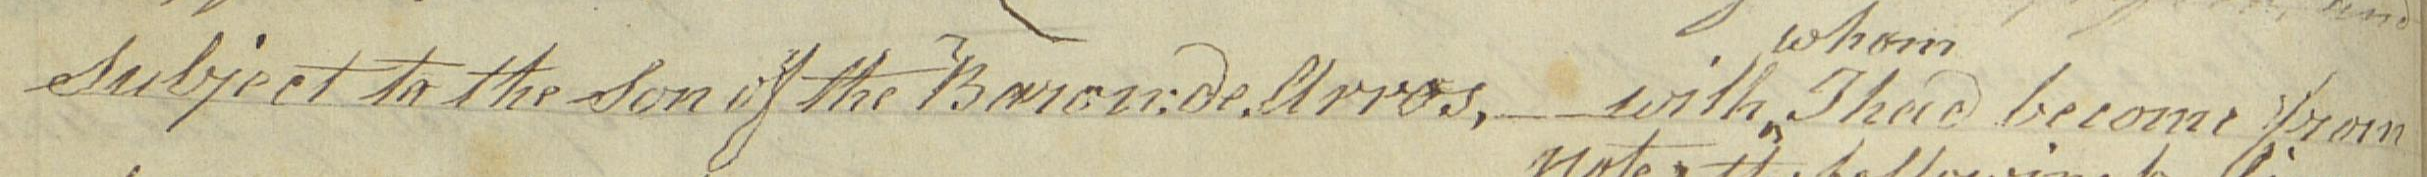subject to the son of the Baron:de Arros, with ^ I had become from
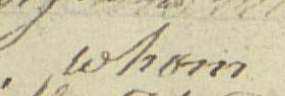whom
